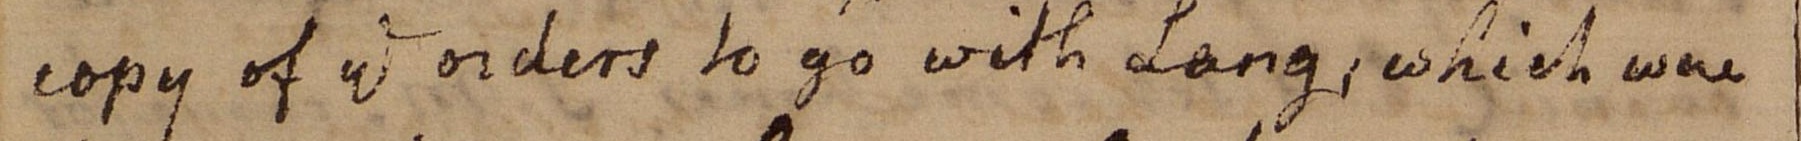copy of y^e orders to go with Lang, which was
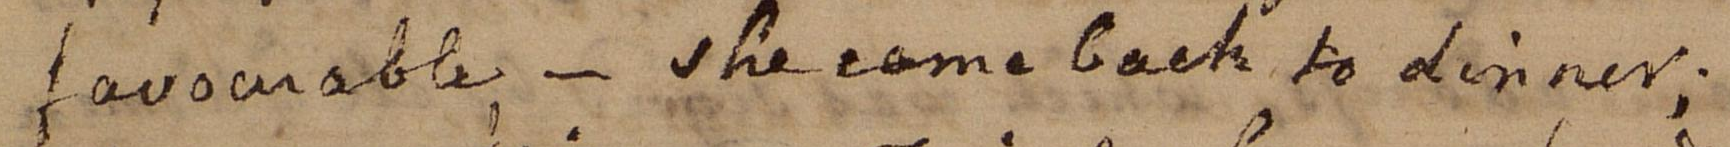favourable- she came back to dinner;
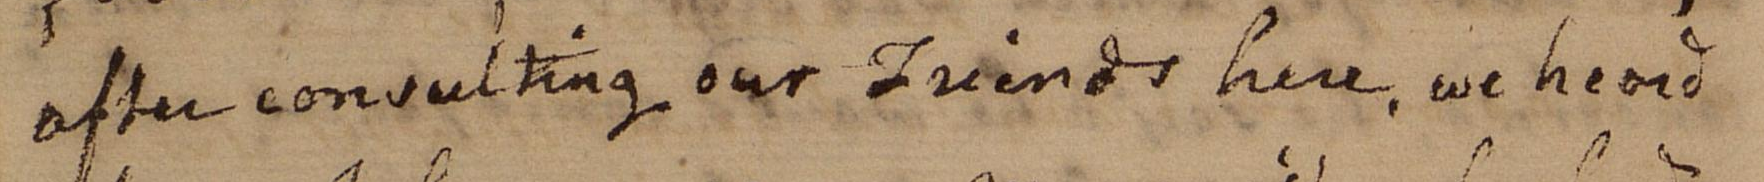after consulting our Friends here, we heard
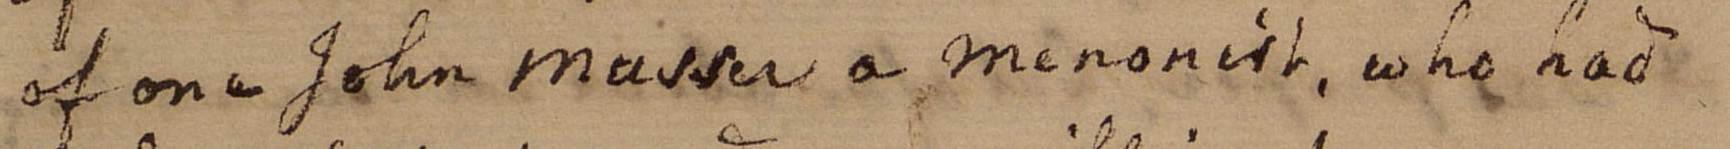of one John Masser a menonist, who had
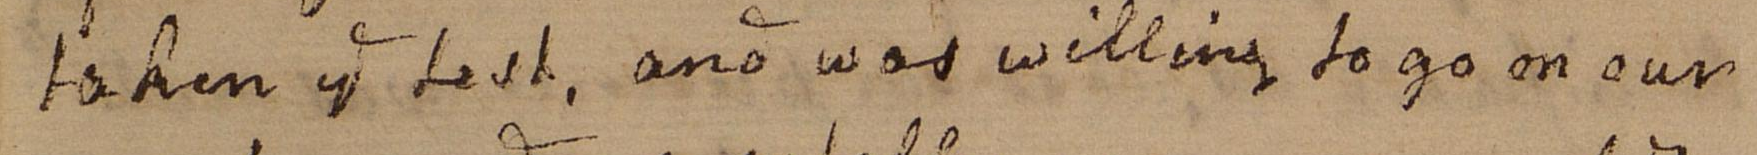taken y^e test, and was willing to go on our
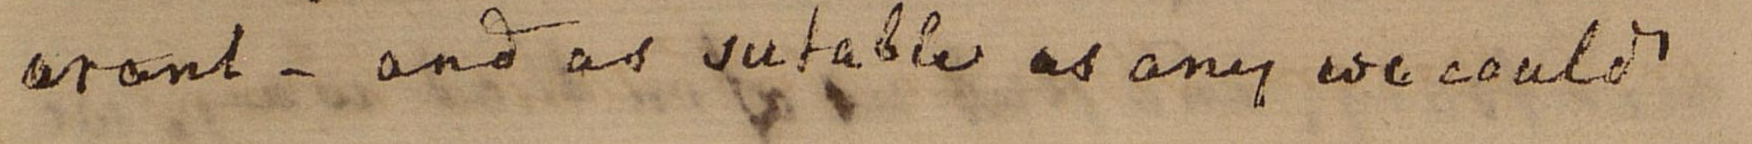erant- and as sutable as any we could
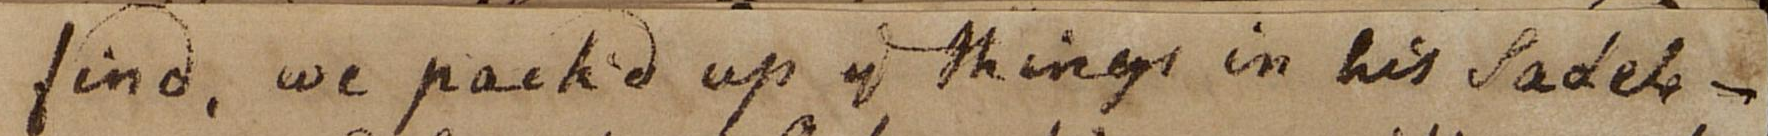find, we pack'd up y^e things in his Sadel-
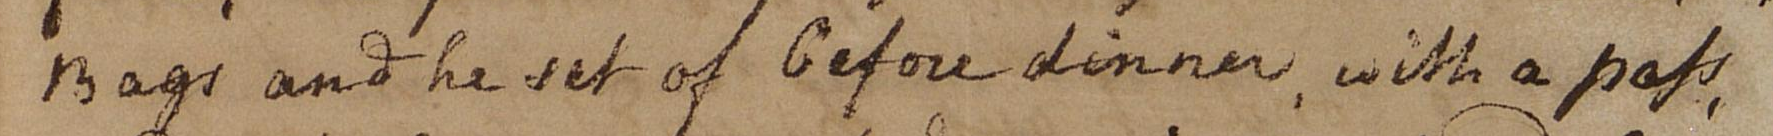Bags and he set of before dinner, with a pass,
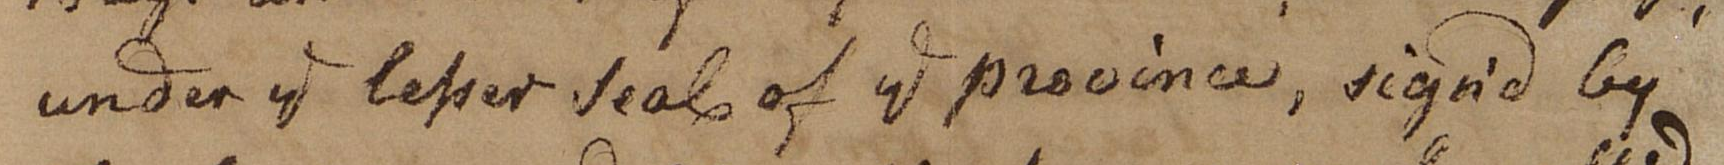under y^e lesser seal of y^e province, sign'd by
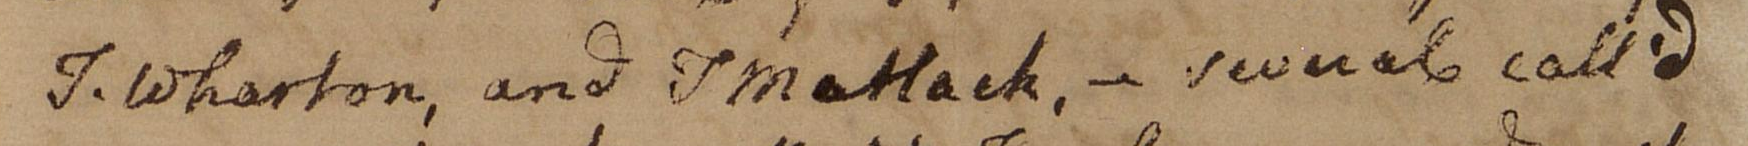T. Wharton, and T Matlack,- several call'd
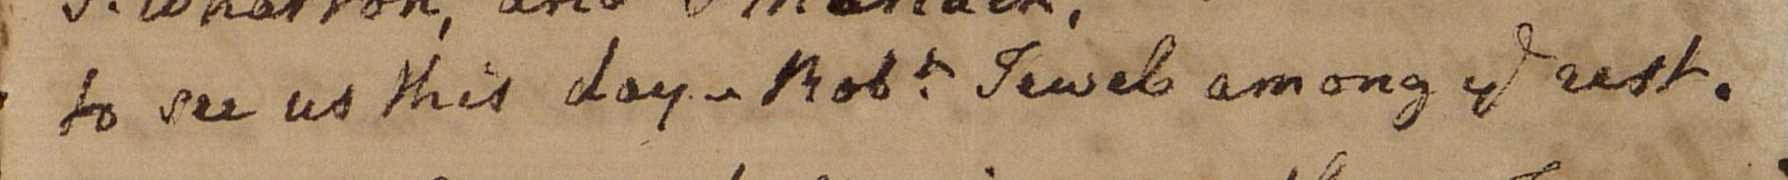to see us this day- Rob^t. Jewel among y^e rest.
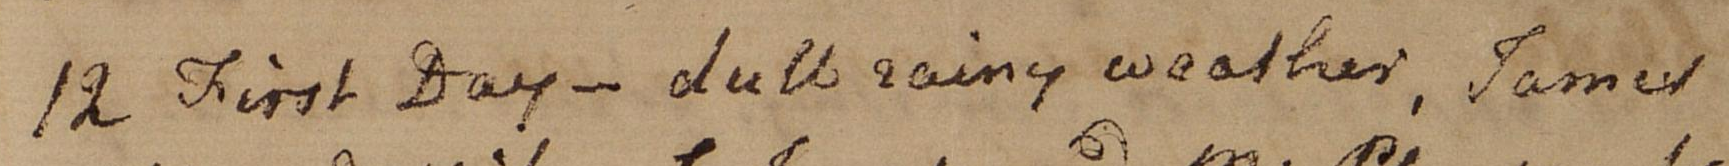12 First Day- dull rainy weather, James
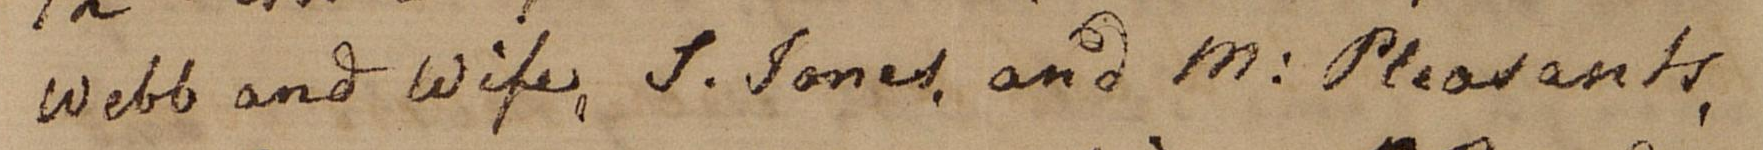Webb and Wife, S. Jones, and M: Pleasants
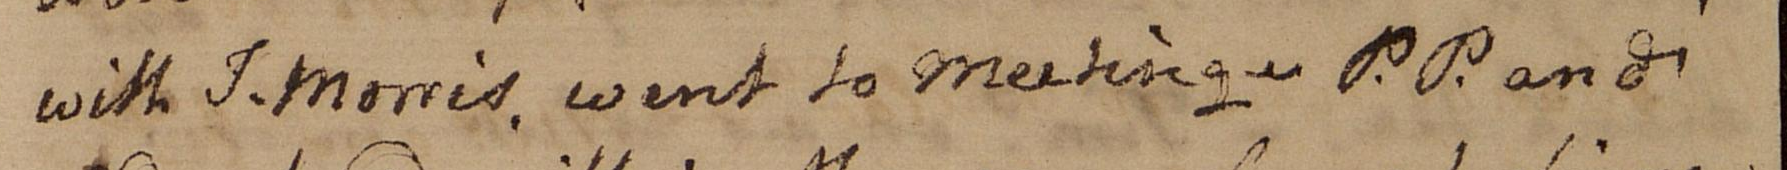with T Morris went to meeting- P. P. and
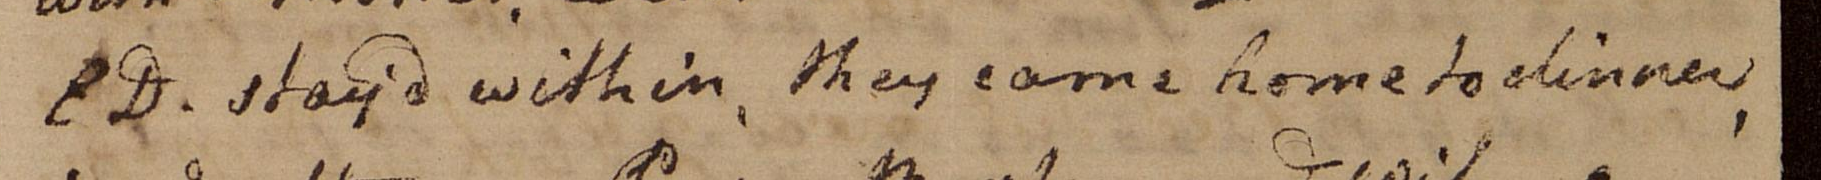E D. stay'd within, they came home to dinner,
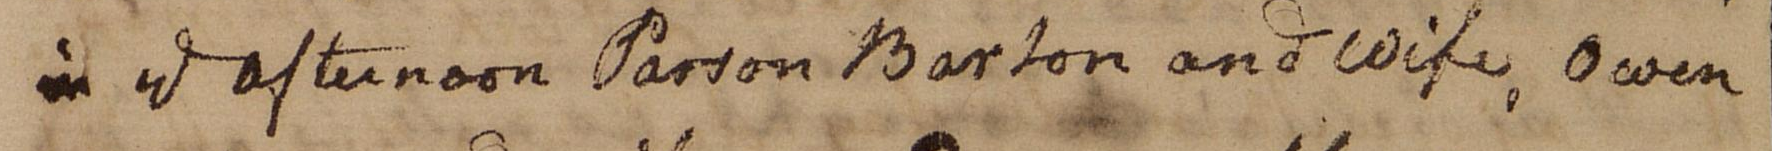in y^e afternoon Parson Barton and Wife, Owen
